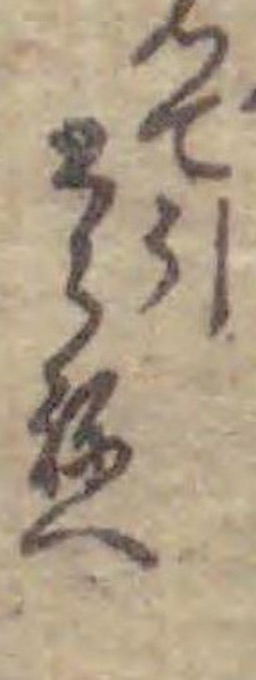とらねへ

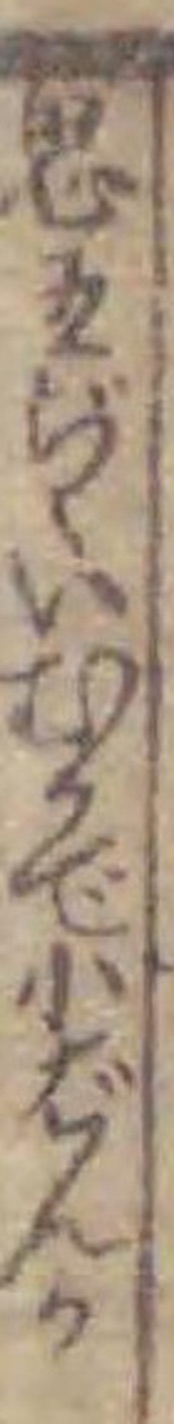鬼王ぢゝいむかで小ばんか
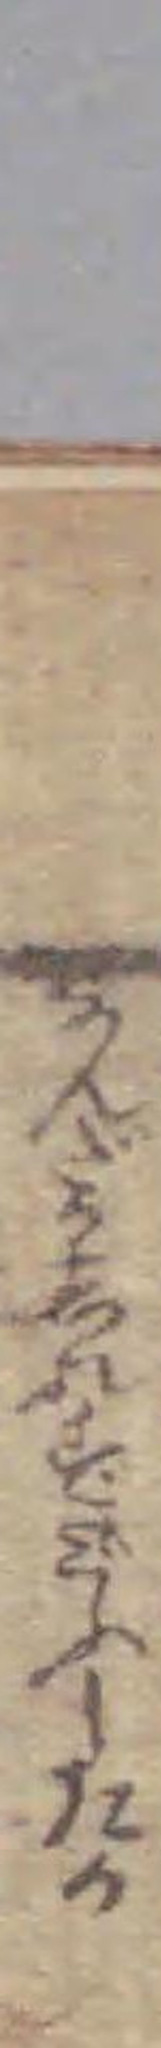なんだかしれすどふしたか
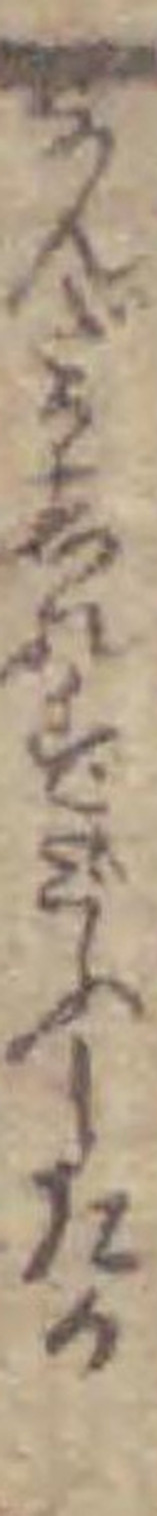なんだかしれすどふしたか
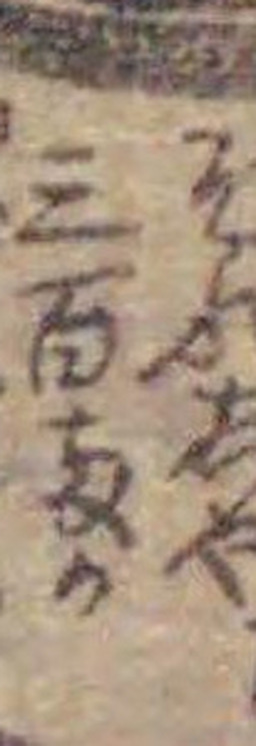三百両か
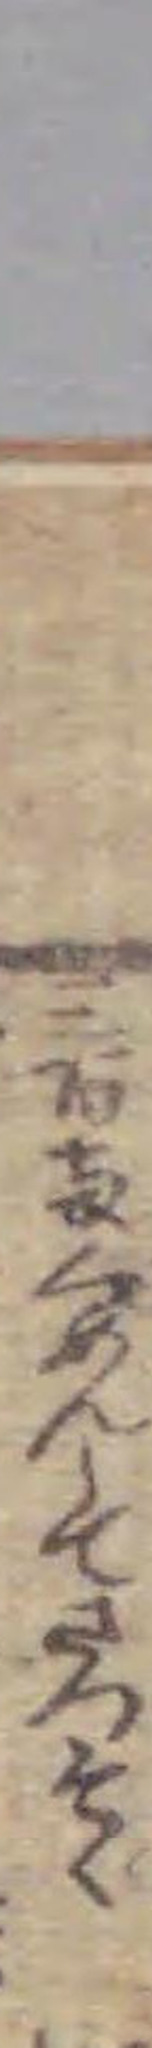三百日両くめんしてさつそく
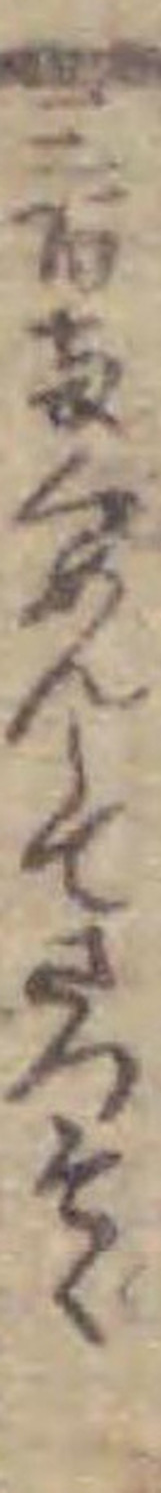三百日両くめんしてさつそく
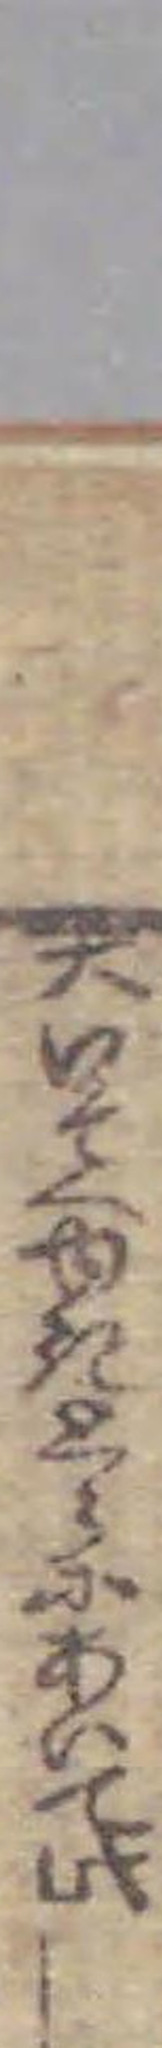大いそへゆきとうにあいて此
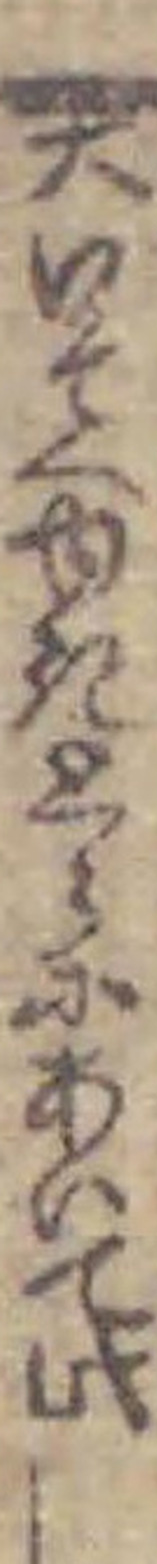大いそへゆきとうにあいて此
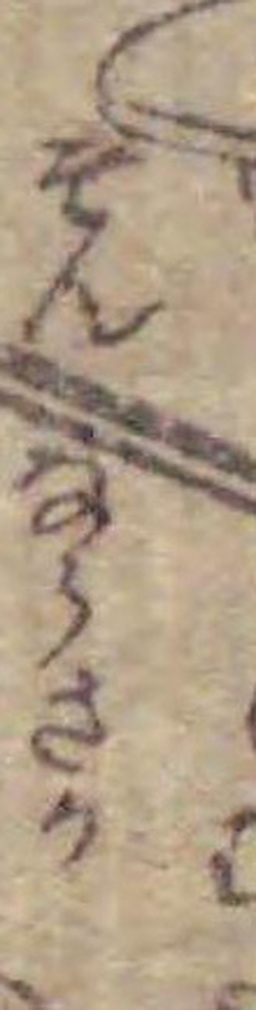そんならさか
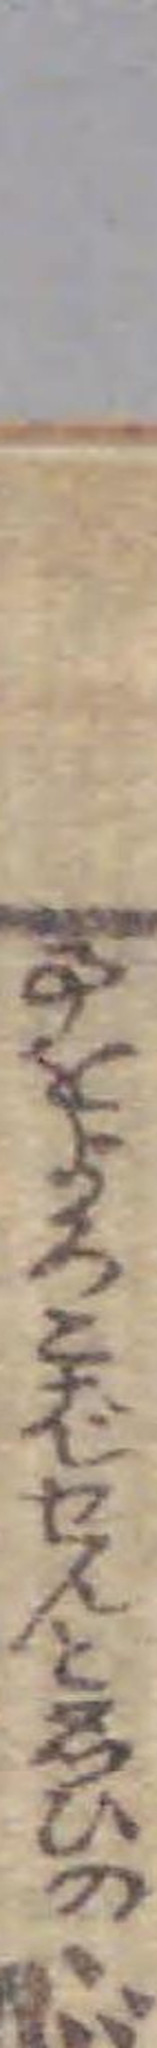事をよろこばせんと思ひの
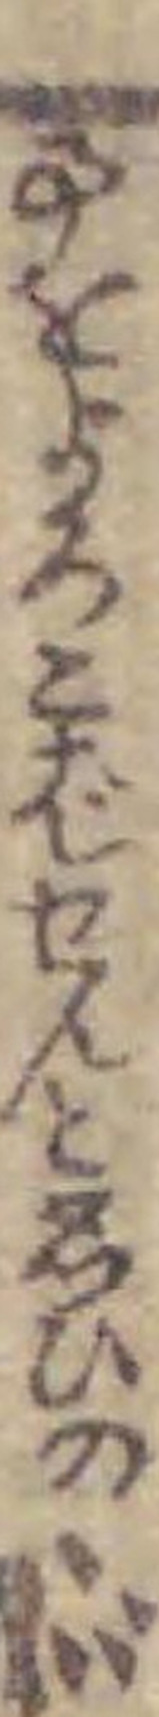事をよろこばせんと思ひの
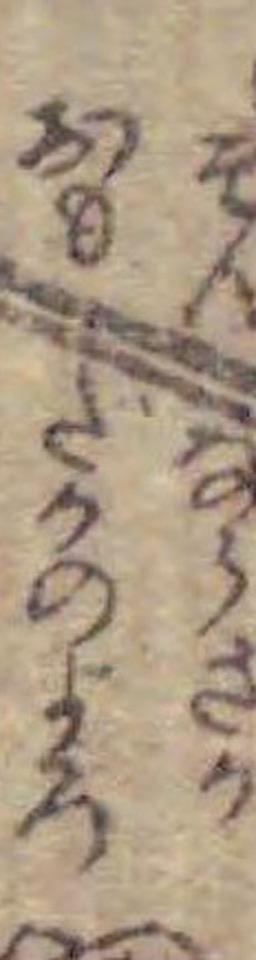おもだかのよろ
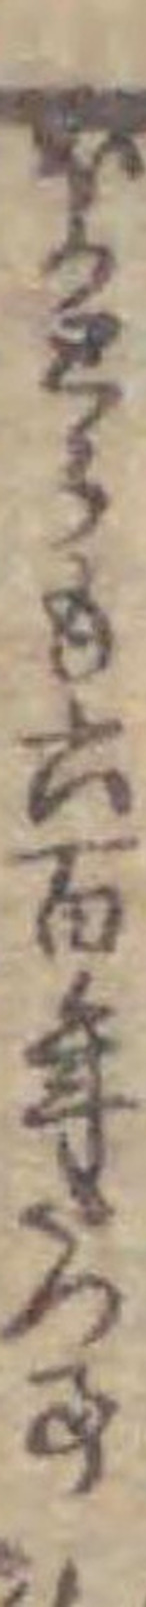ほかとうも六百年たつ事
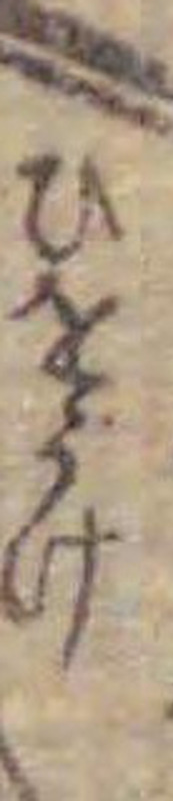ひをうけ
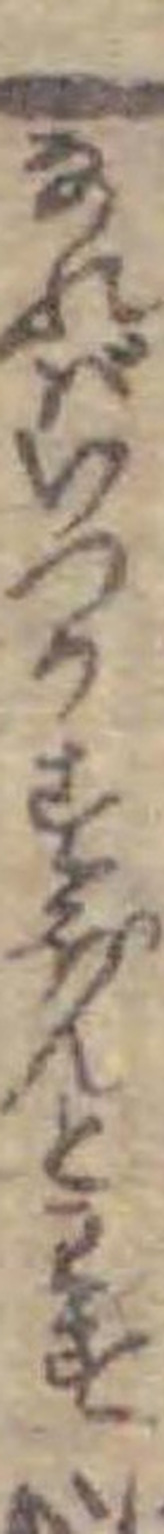なればいつかすぽんとわす
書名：年寄之冷水曽我 : 3巻
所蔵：国立国会図書館 National Diet Library, JAPAN
